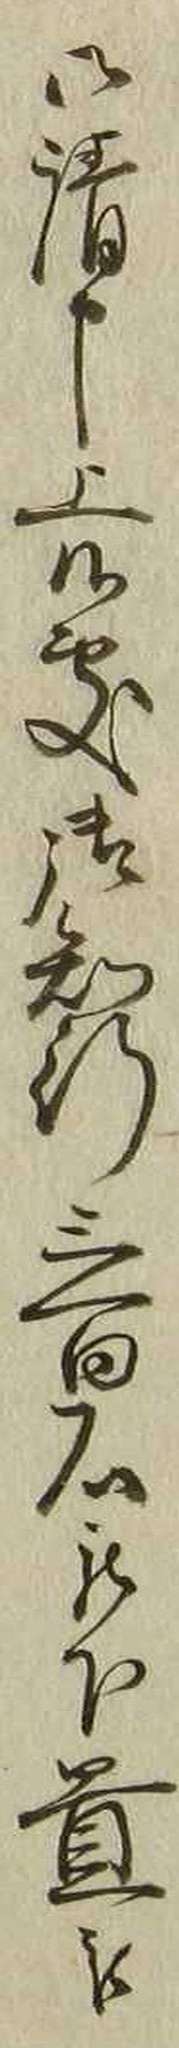御請申上候處御知行三百石被下置被
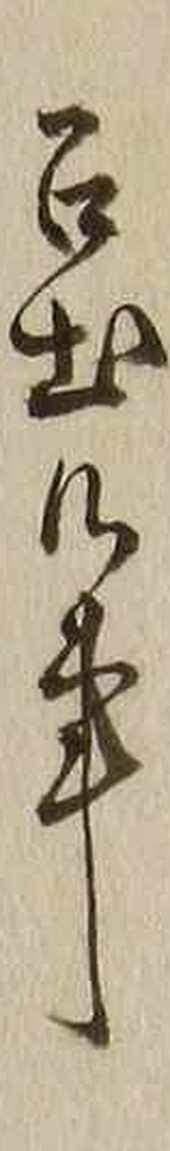召出候事
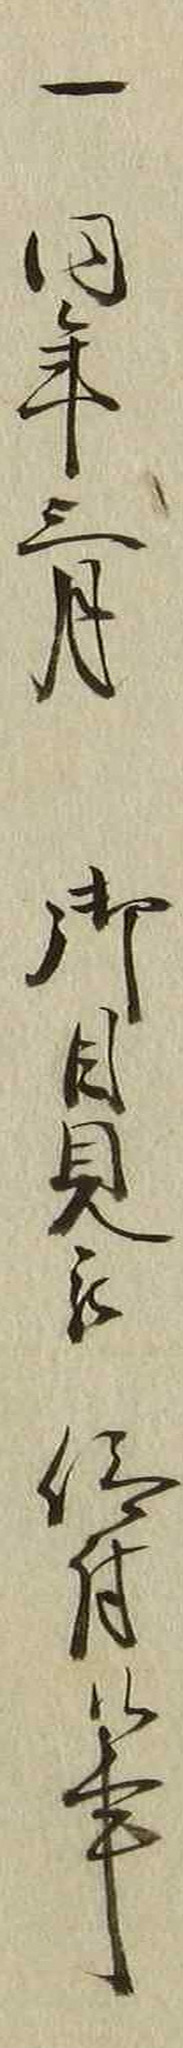一同年三月御目見被仰付候事
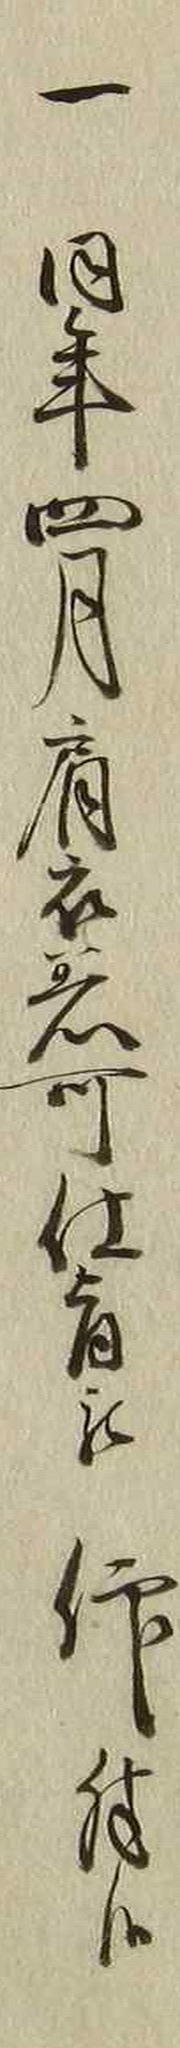一同年四月肩衣着可仕旨被仰付候
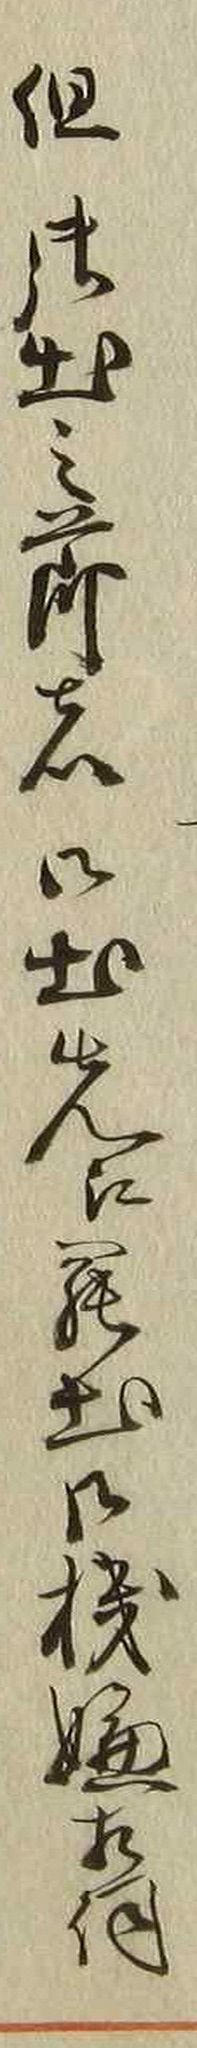但御出之節者御出先江罷出御機嫌相伺
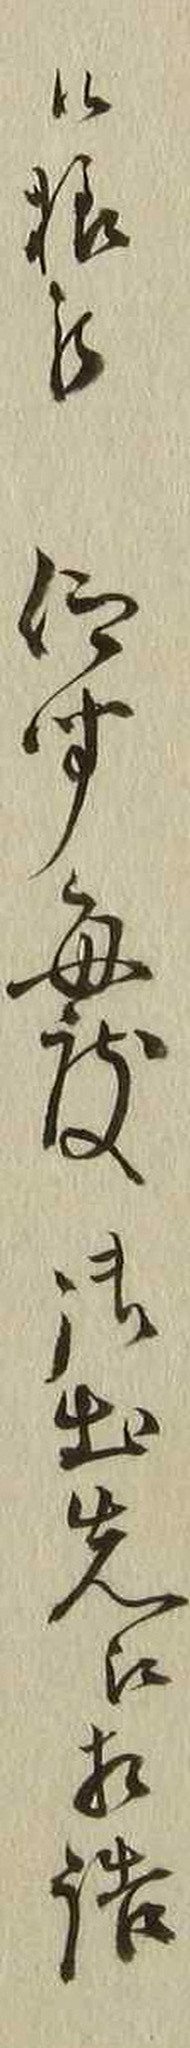候様被仰聞毎度御出先江相詰
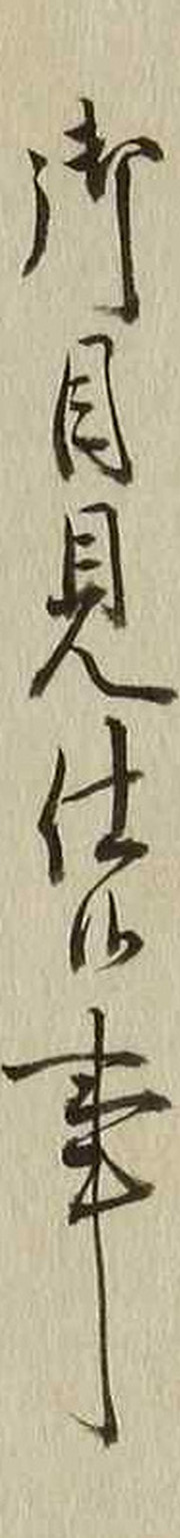御目見仕候事
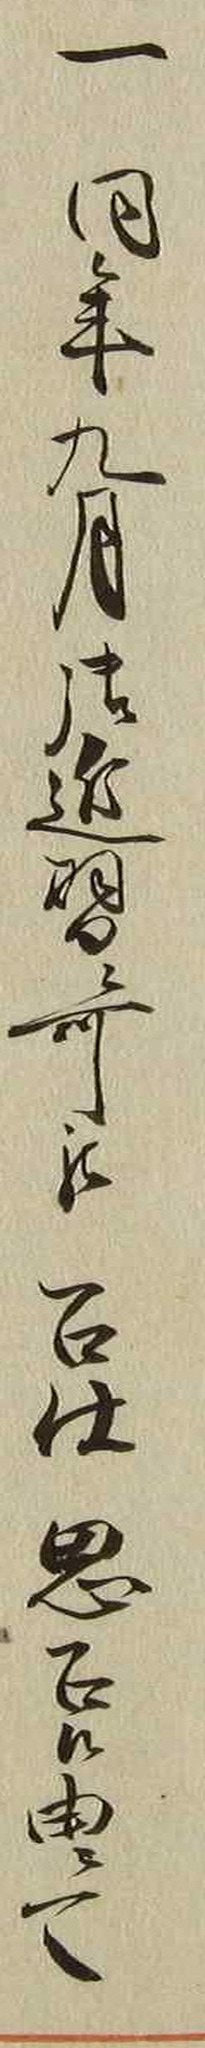一同年九月御近習ニ可被召仕思召候由ニて
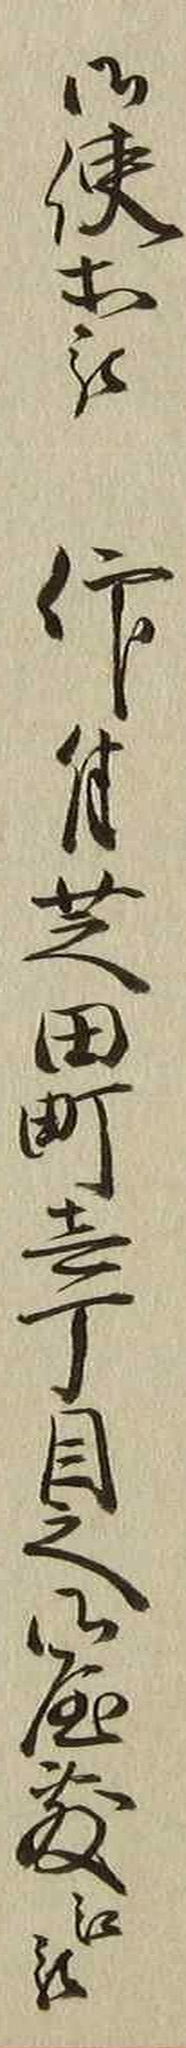御使等被仰付芝田町壱丁目之御屋敷江被
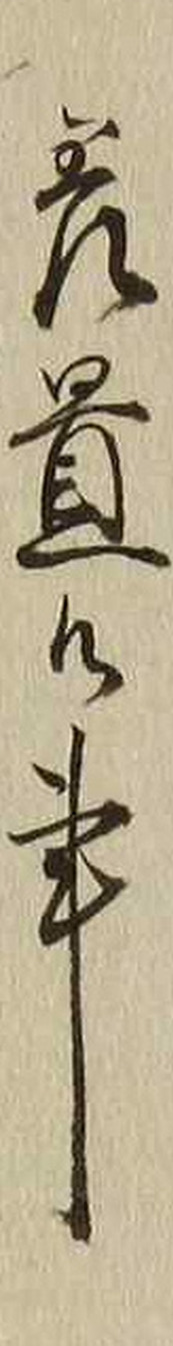差置候事
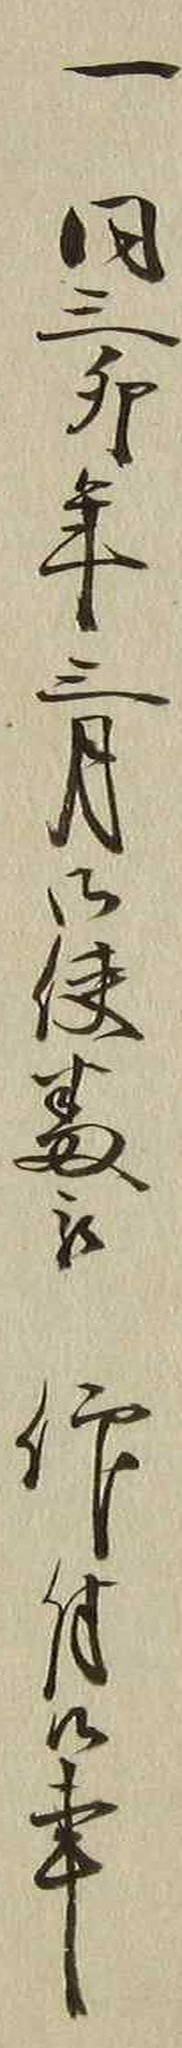一同三卯年三月御使番被仰付候事
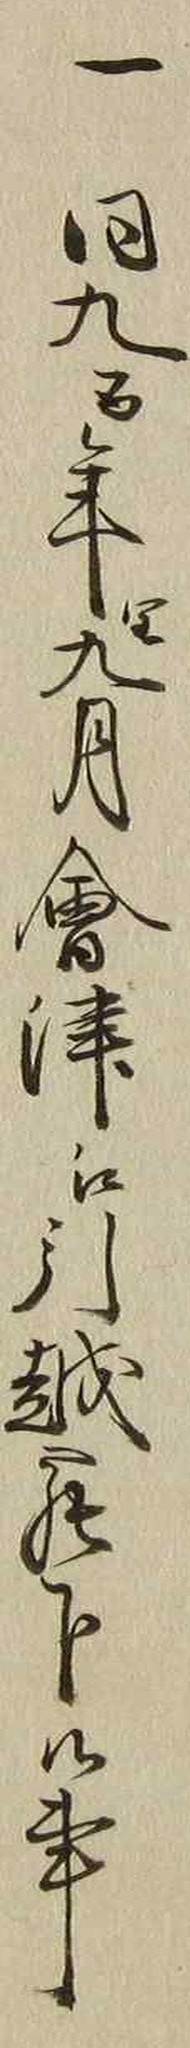一同九酉年閏九月会津江引越罷下候事
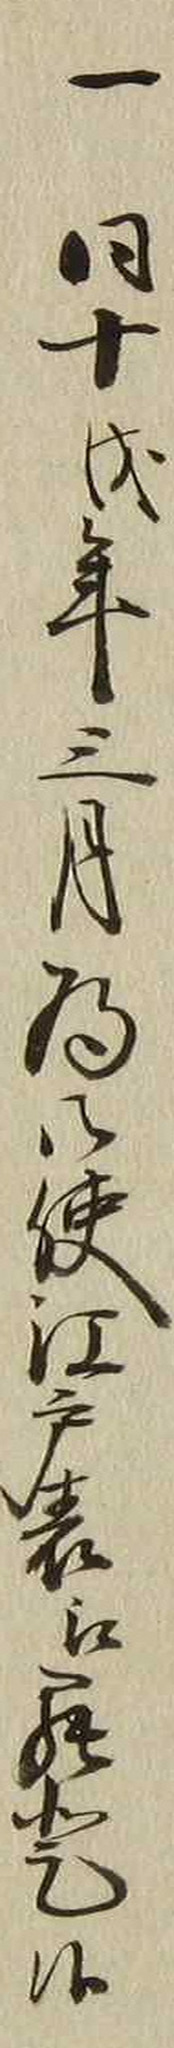一同十戌年三月為御使江戸表江罷登候
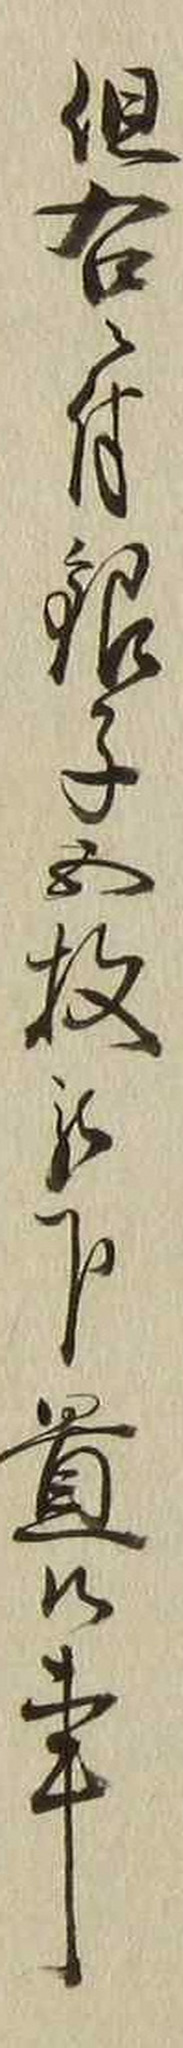但右ニ付銀子五枚被下置候事
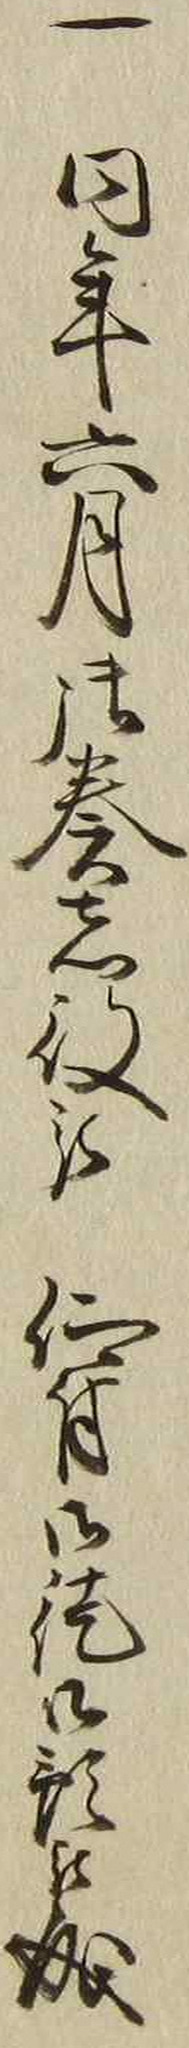一同年六月御奏者役被仰付御徒御頭被成
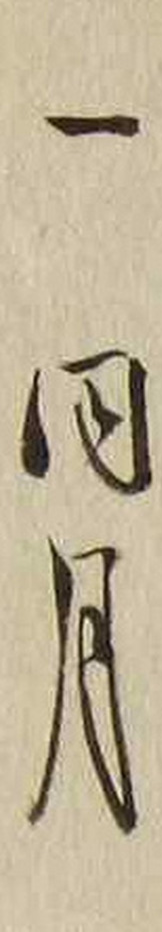一同月
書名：諸士系譜　巻之65　ち之部1
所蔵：会津若松市立会津図書館
